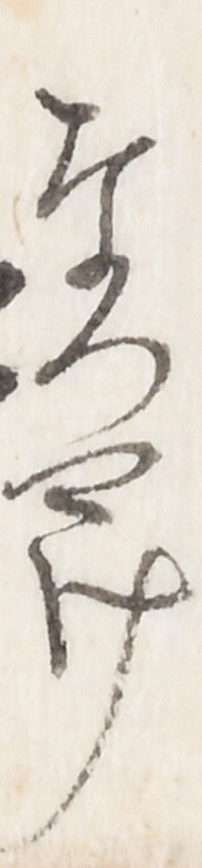なつやけ
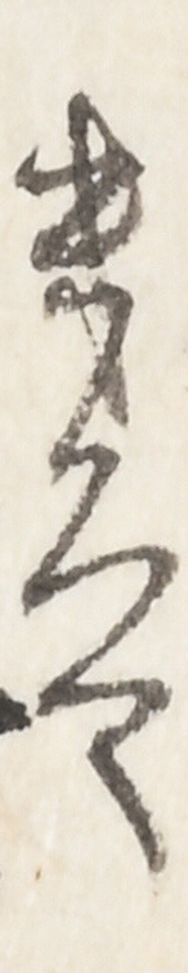きくや

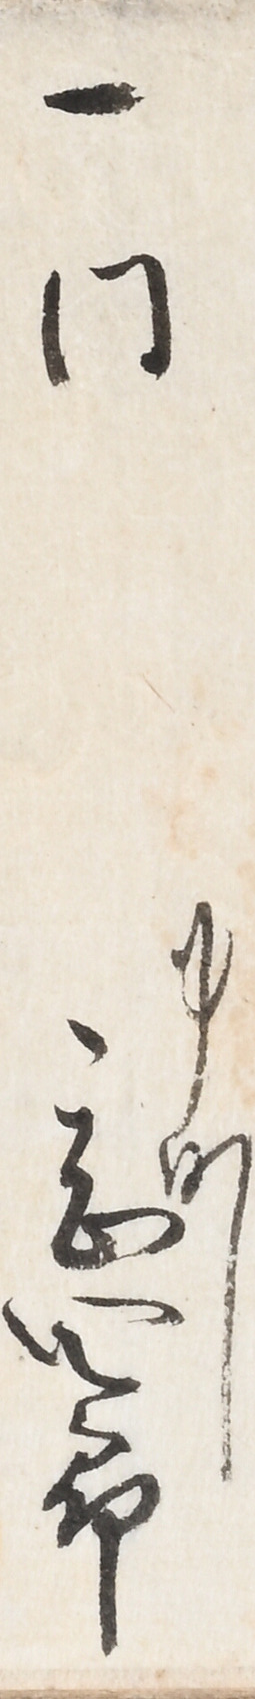一同甚四郎
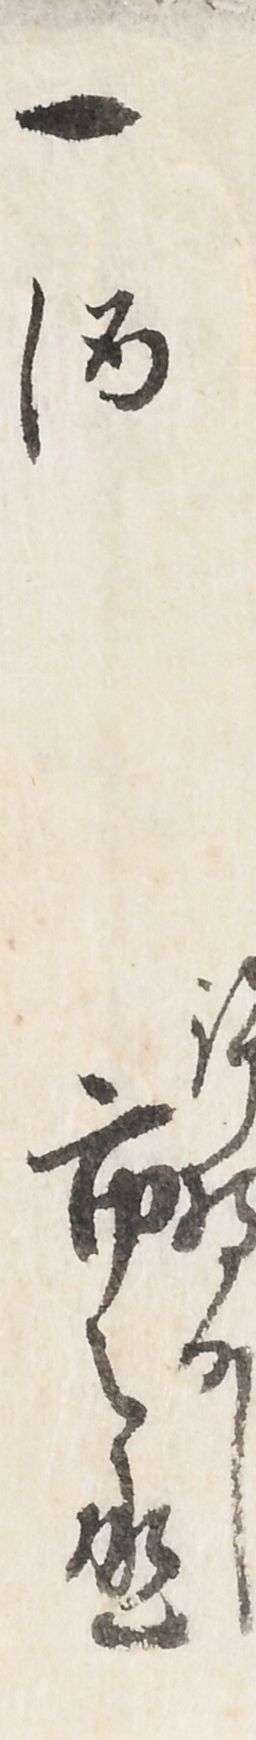一酒市之丞
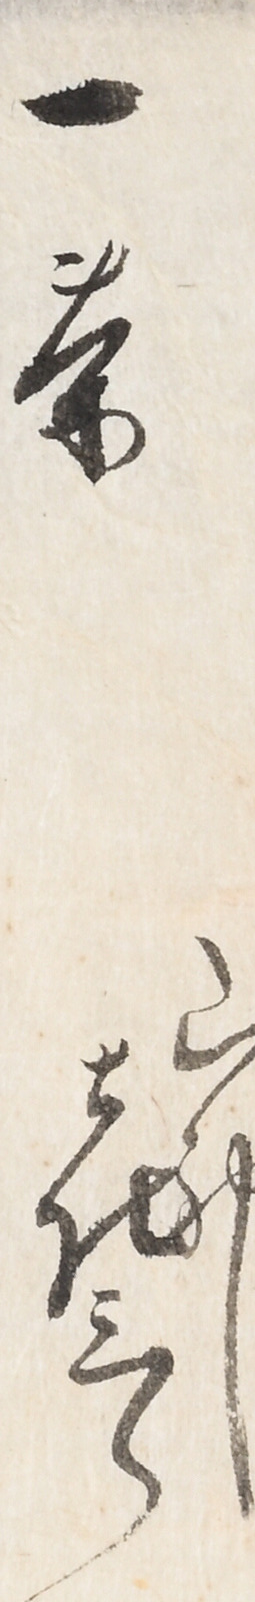一茶喜三郎
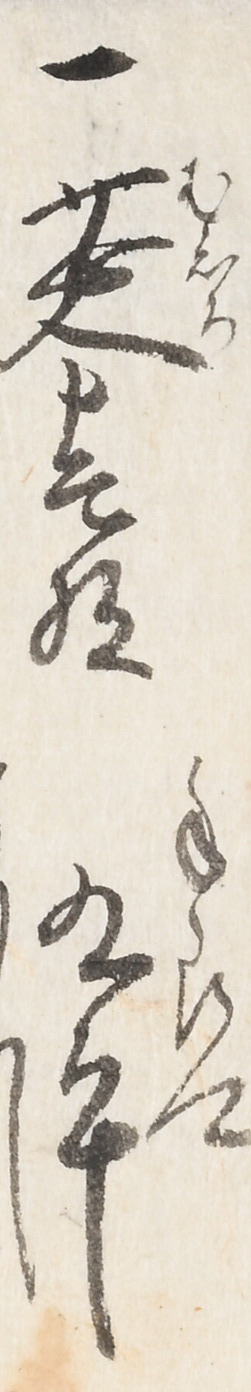一莚壱枚九平
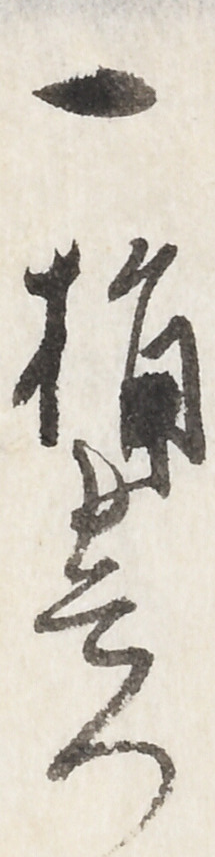一茶作右衛門
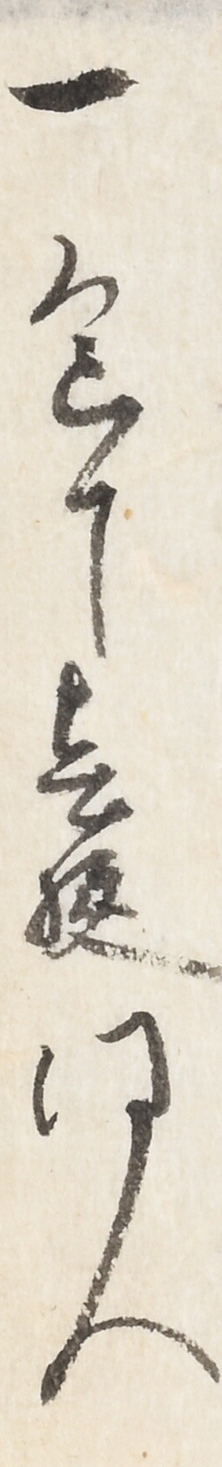一包丁壱挺同人
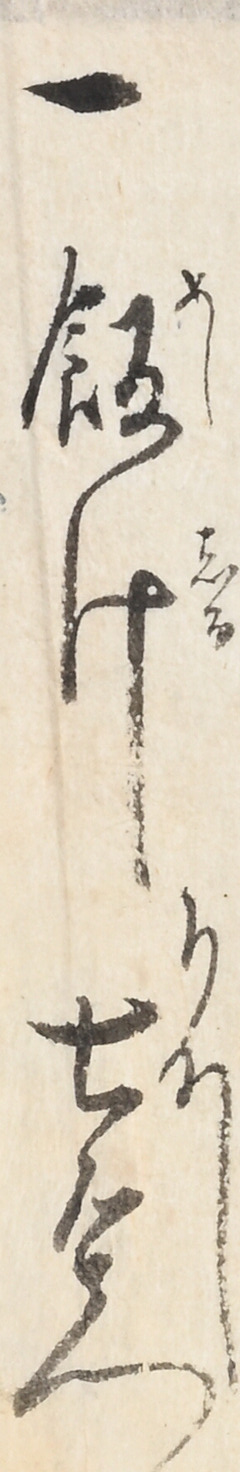一飯汁七右衛門
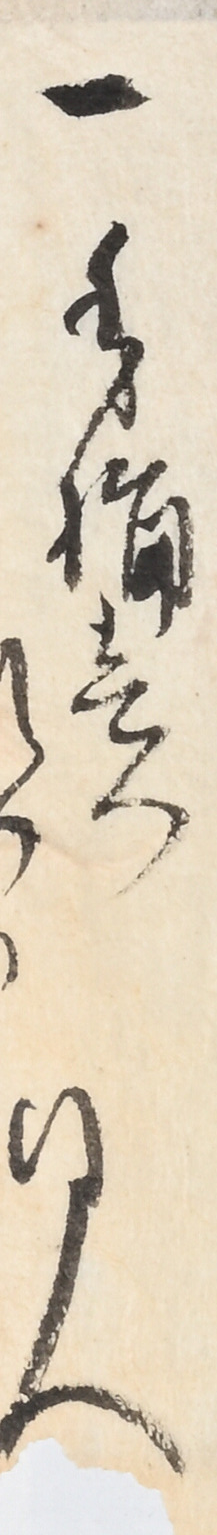一手桶壱つ同人
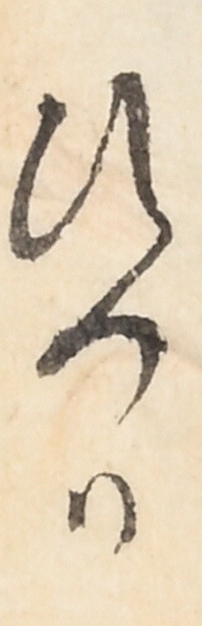ひつ同

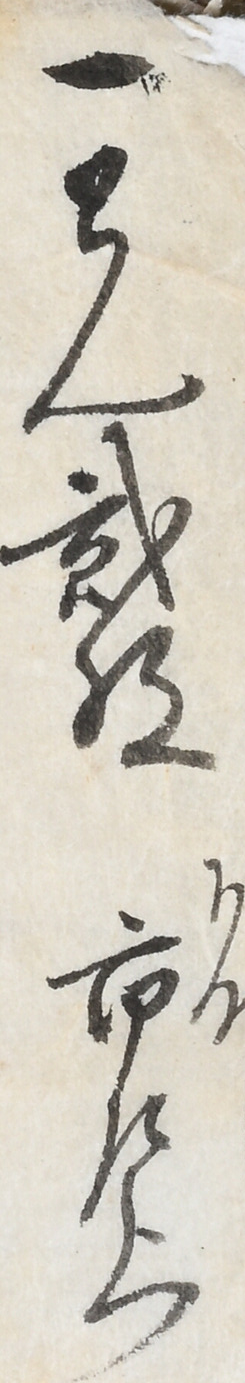一せん弐枚市左衛門
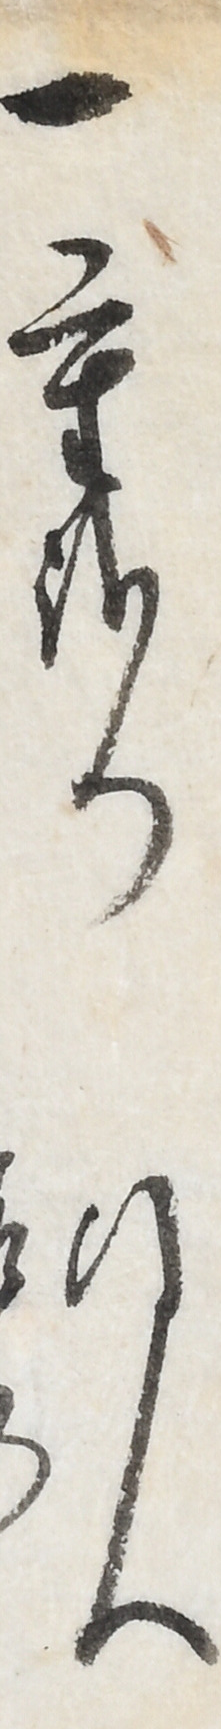一重弐つ同人
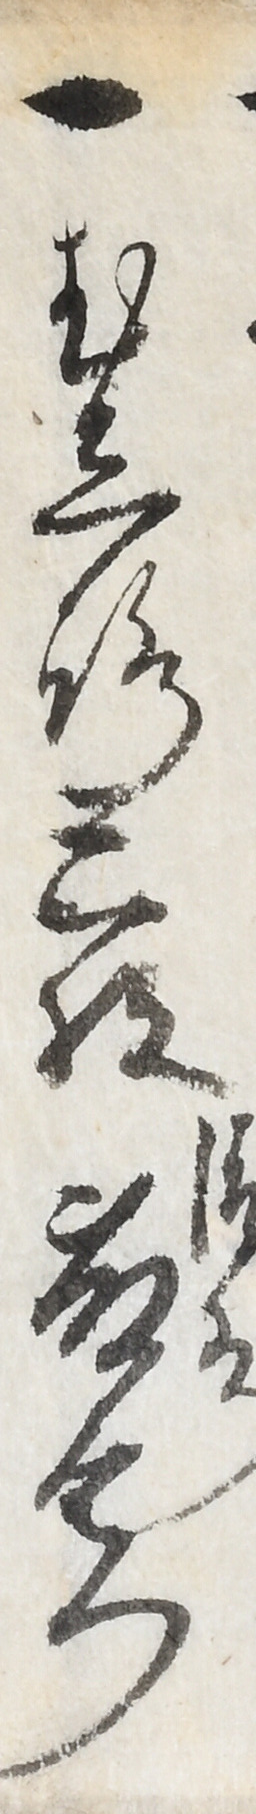一むしろ三枚藤左衛門
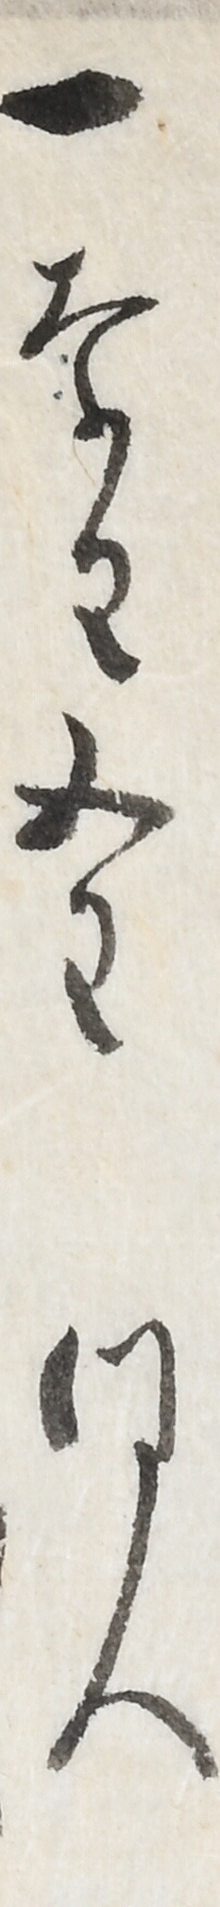一なわ五わ同人
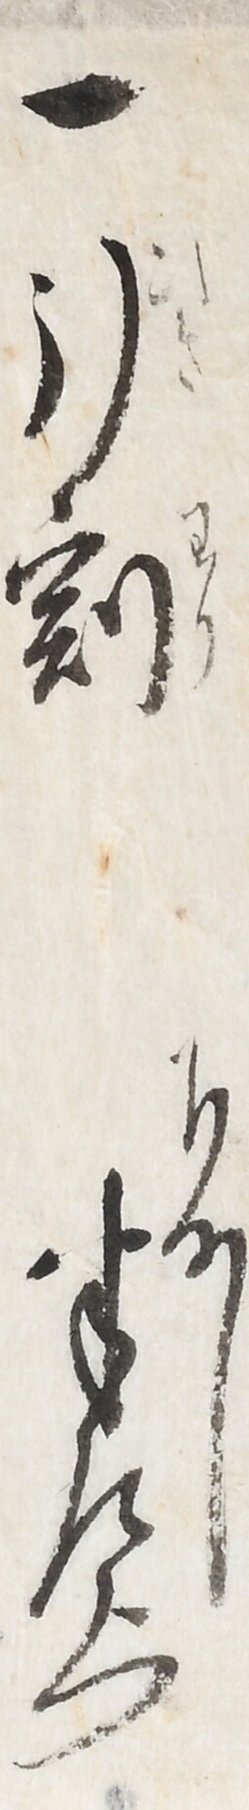一引割半左衛門
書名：合力覚帳
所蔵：伊那市立高遠町図書館・合同会社AMANE
